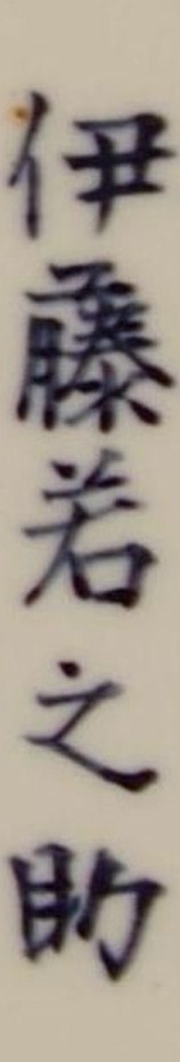伊藤若之助
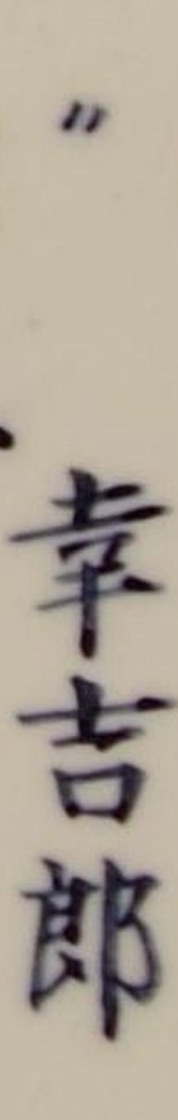幸吉郎
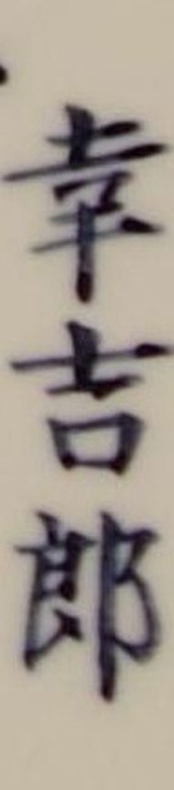幸吉郎
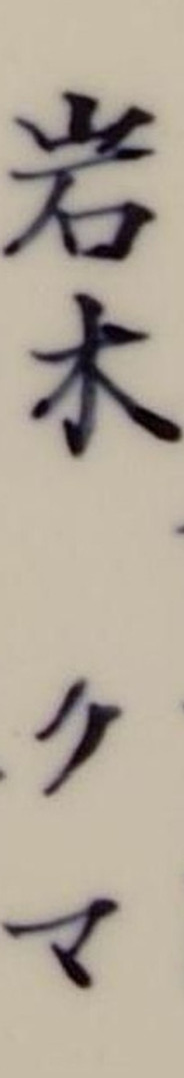岩木クマ
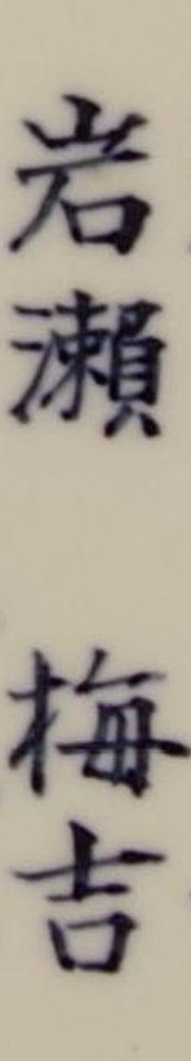岩瀬梅吉
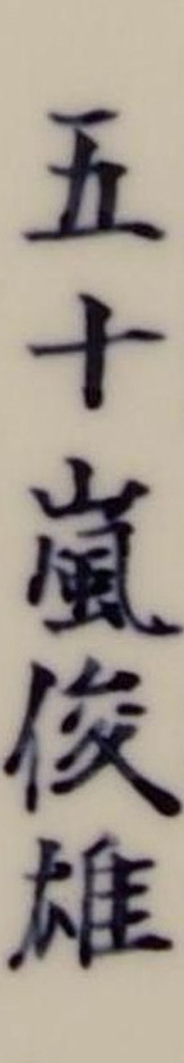五十嵐俊雄
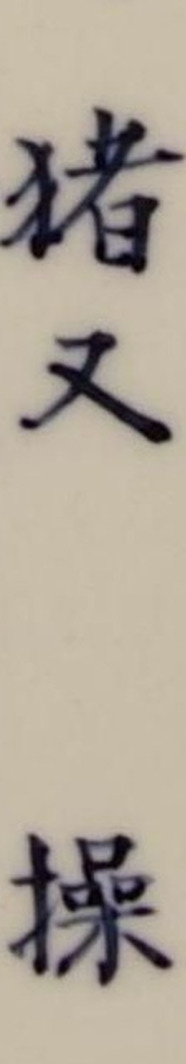猪又操
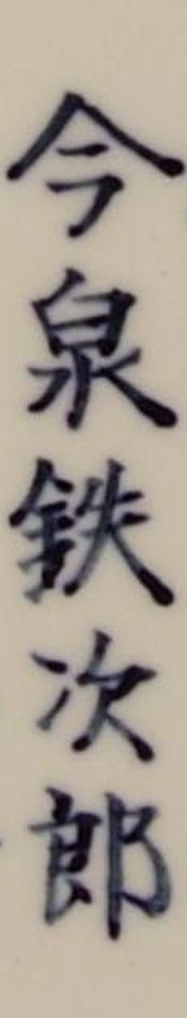今泉鉄次郎
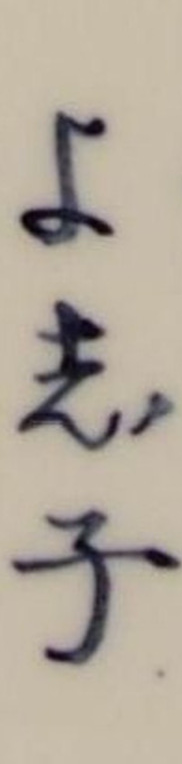よし子
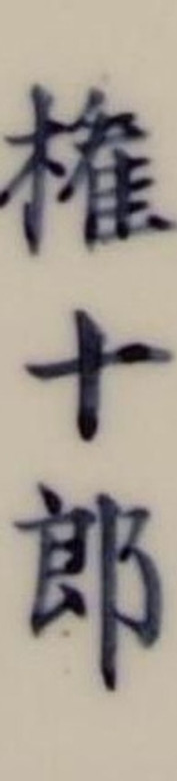権十郎
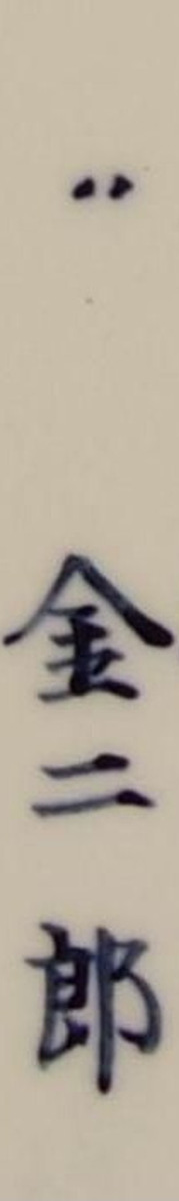金二郎
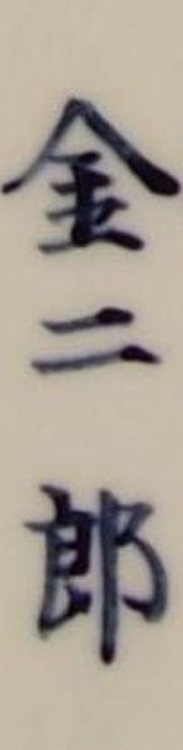金二郎
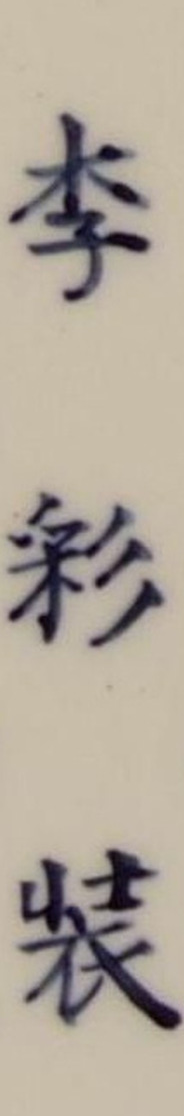李彩装
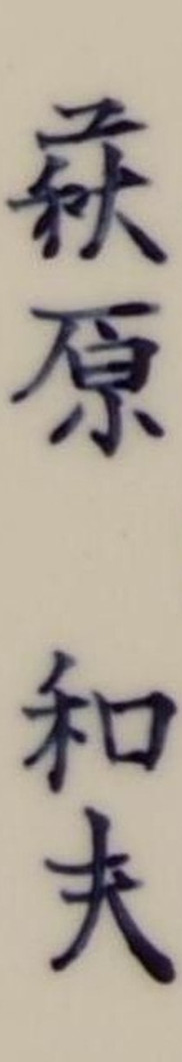萩原和夫
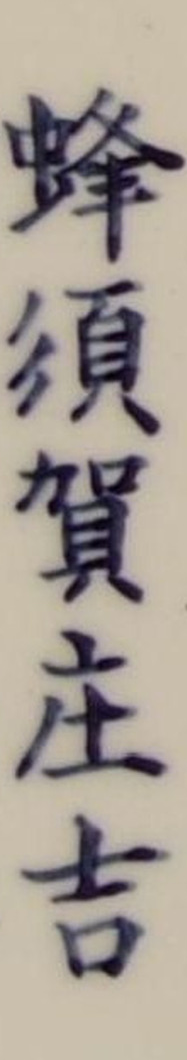蜂須賀庄吉
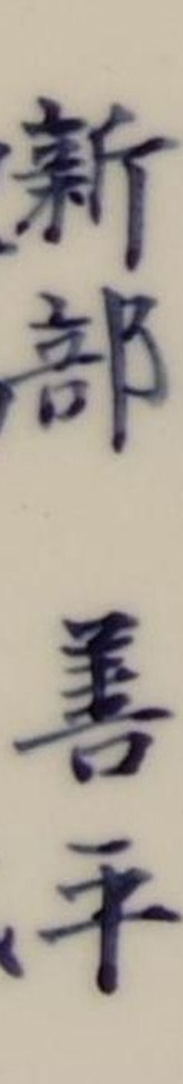新部善平
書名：M~S
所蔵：高野山金剛峯寺
